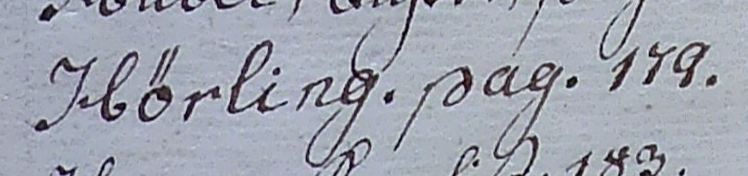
Hörling. pag. 179.
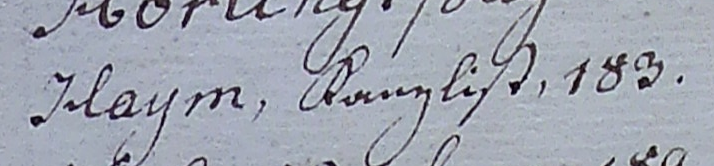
Haym, Kanzlist, 183.
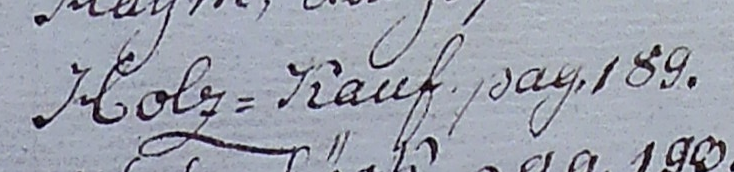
Holz=Kauf. pag. 189.
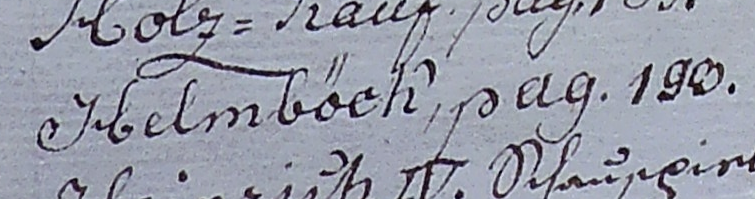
Helmböck, pag. 193.
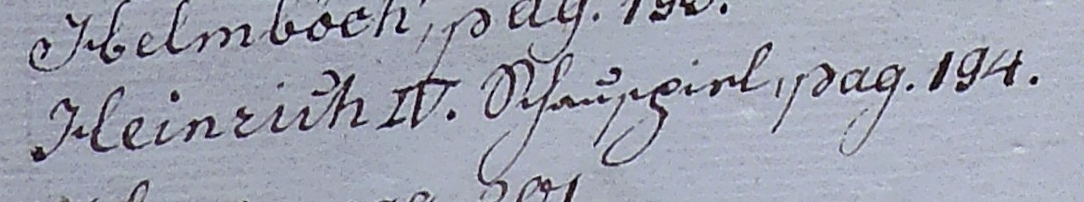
Heinrich IV. Schauspiel, pag. 194.
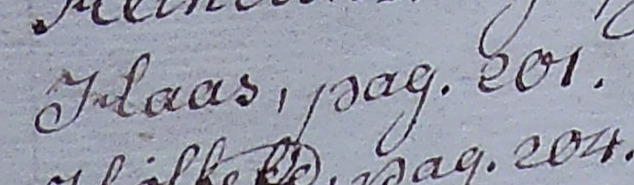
Haas, pag. 201.
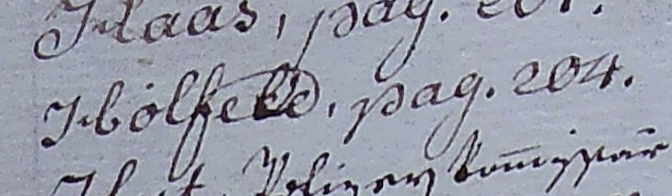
Holfeld, pag 204.
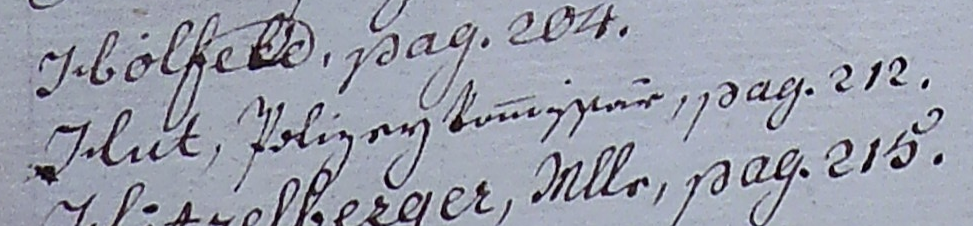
Hut, Polizeykom̅issär, pag. 212.
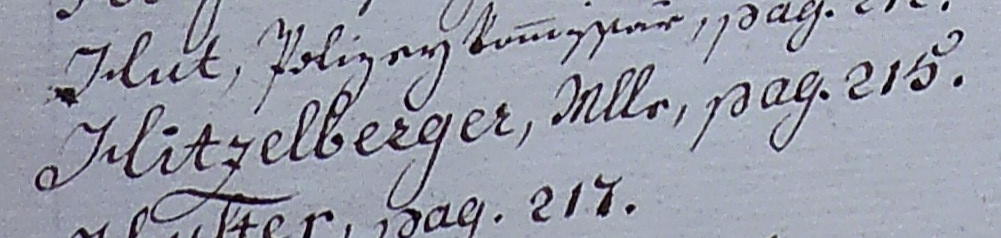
Hitzelberger, Mlle, pag. 215.
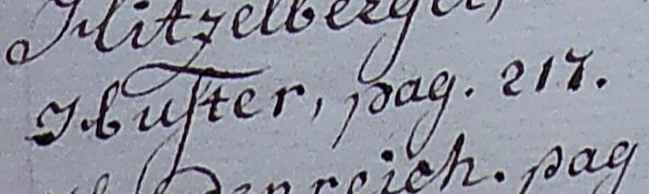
Huster, pag. 217.
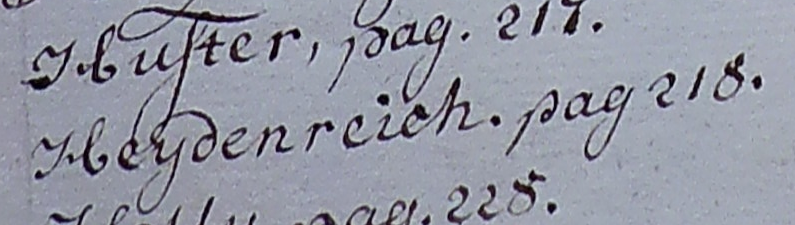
Heydenreich. pag 218.
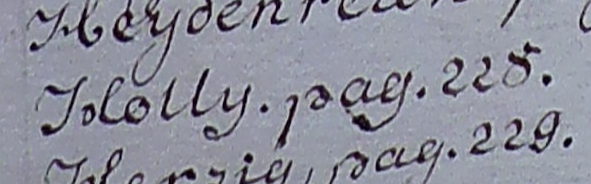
Holly. pag. 228.
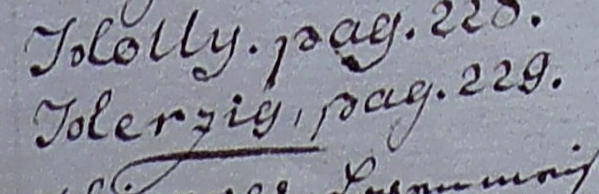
Herzig, pag. 229.
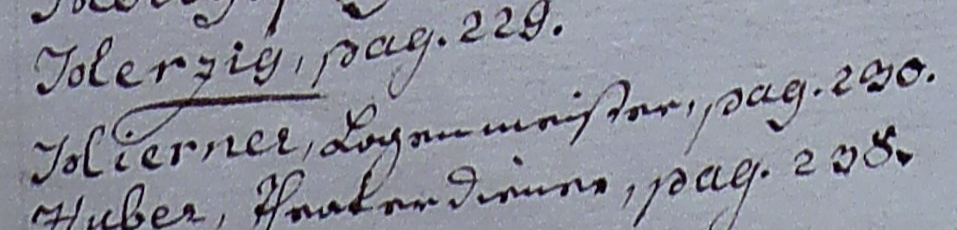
Hierner, Logenmeister, pag. 230.
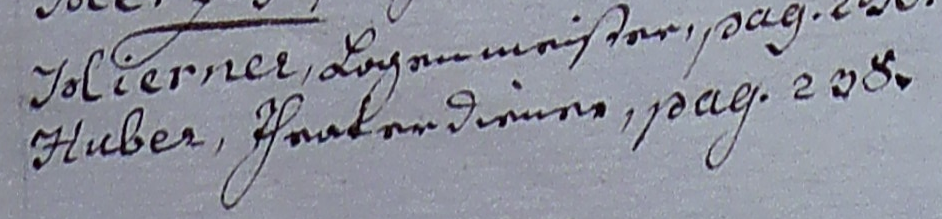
Huber, Theaterdiener, pag. 238.
